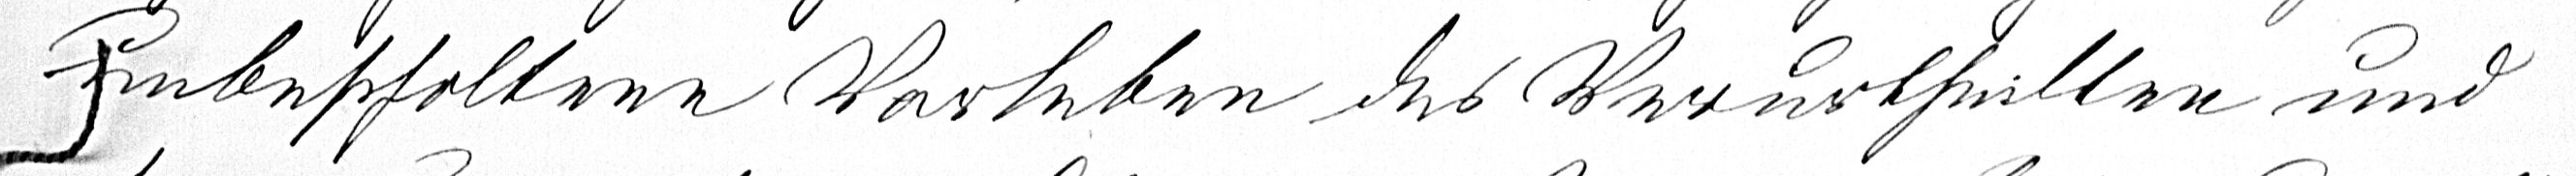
unbescholtene Vorleben des Verurtheilten und
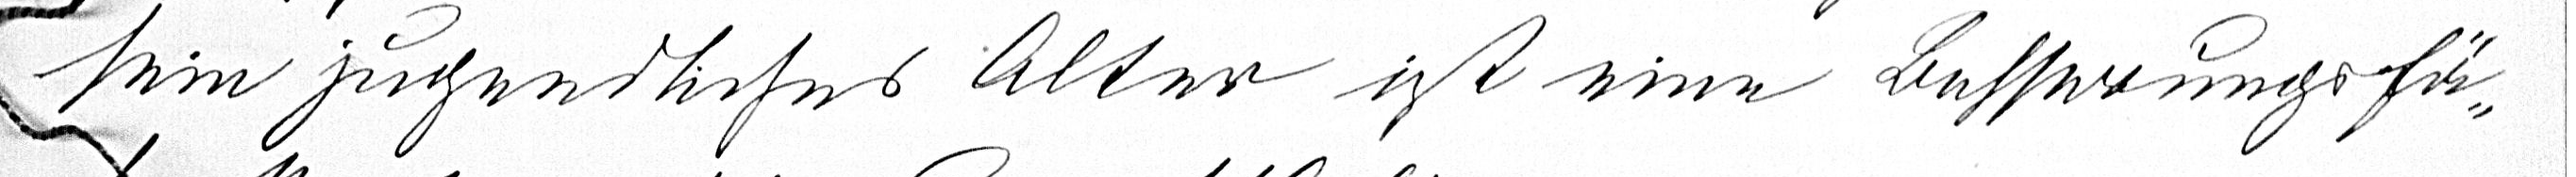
sein jugendliches Alter ist eine Besserungsfä¬
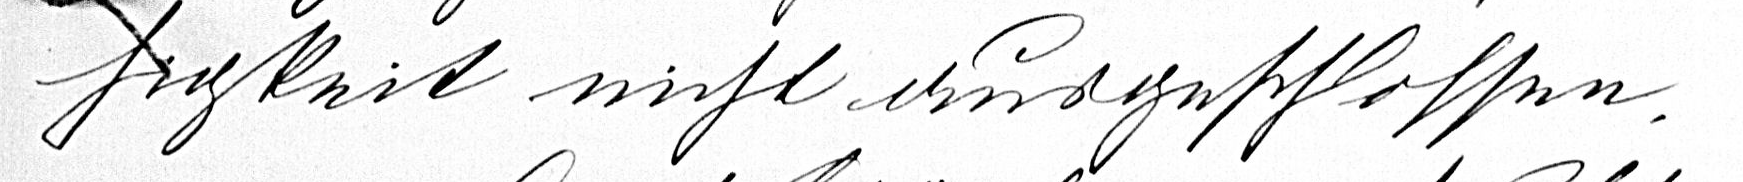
higkeit nicht ausgeschlossen.
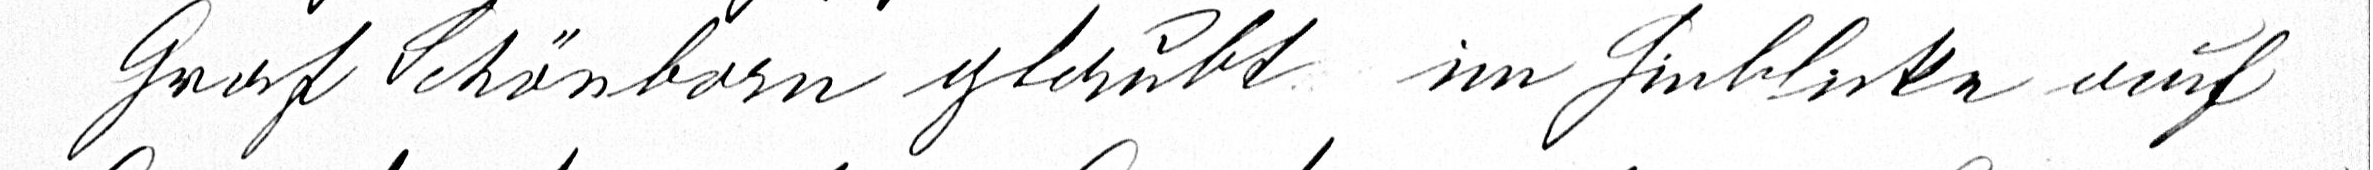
Graf Schönborn glaubt im Gieblicke auf
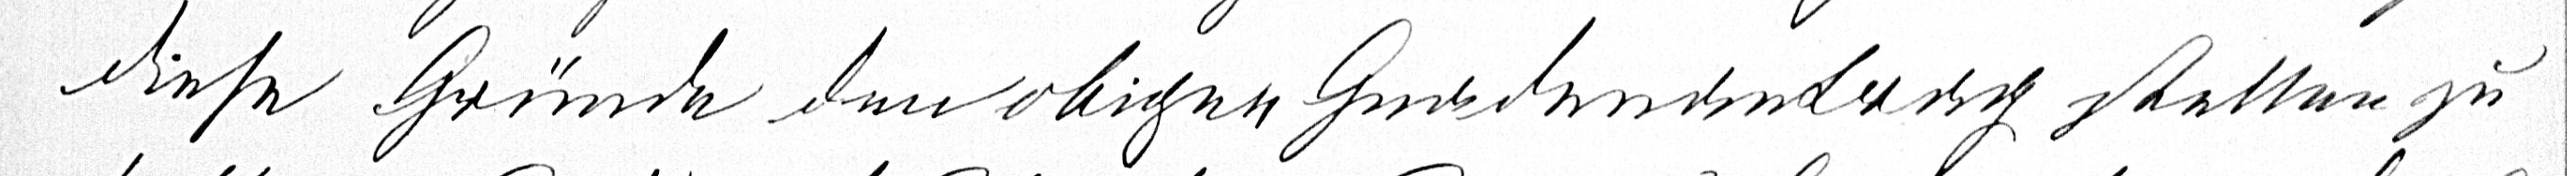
diese Gründe den obigen Gnadenantrag stellen zu
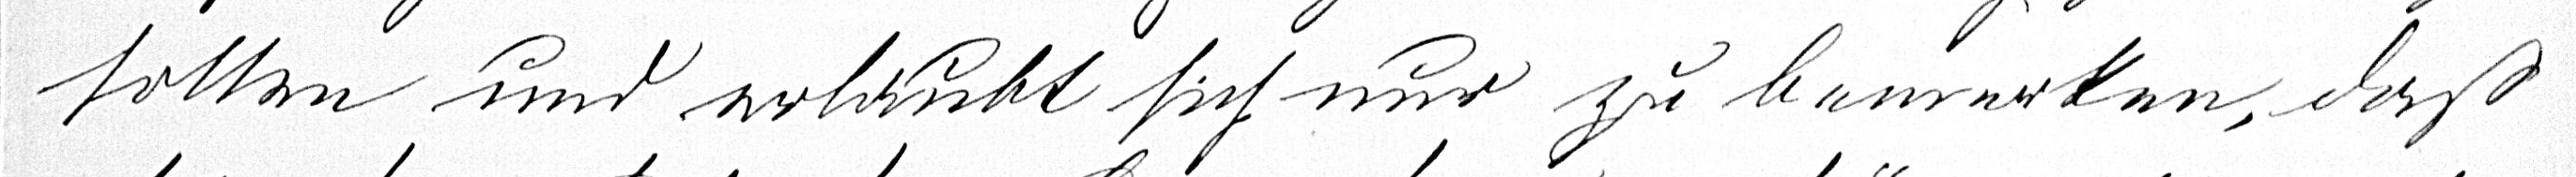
sollen und erlaubt sich nur zu bemerken, daß
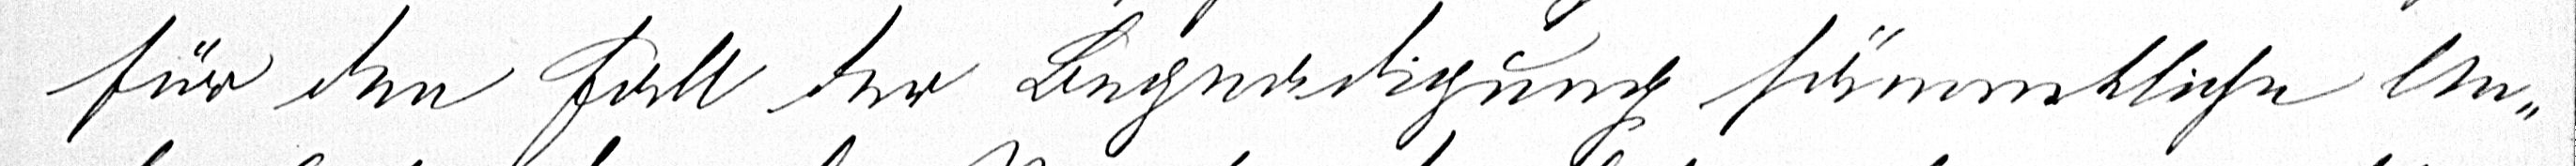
für den Fall der Begnadigung sämmtliche Un¬
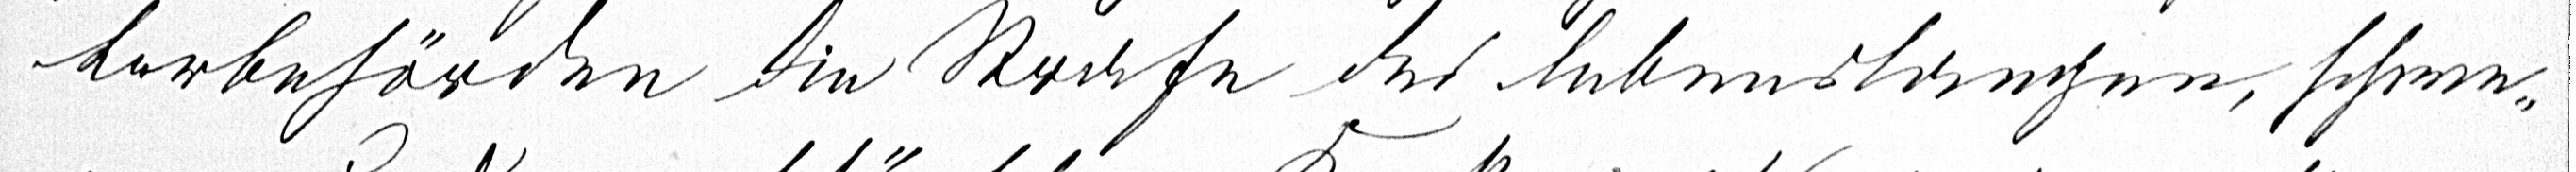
terbehörden die Strafe des lebenslangen, schwe¬
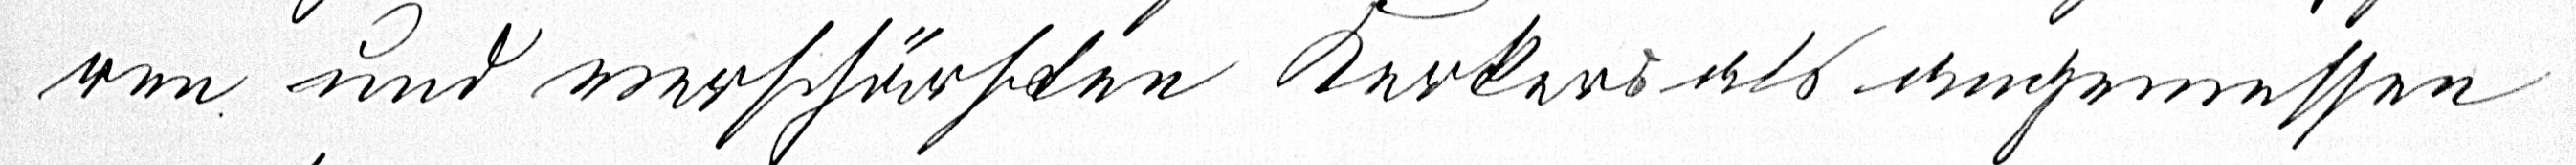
ren und verschärften Kerkers als angemessen
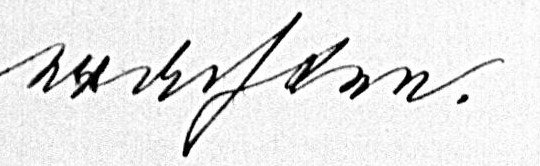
erachten.
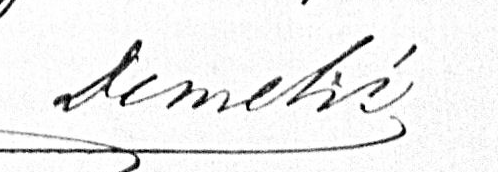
xx
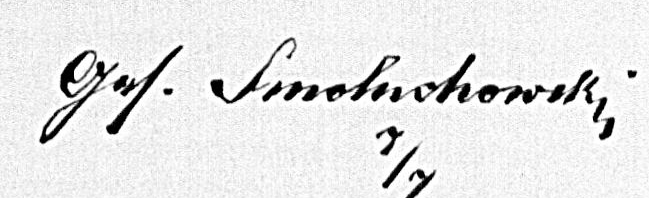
Ges. Smolnchowski
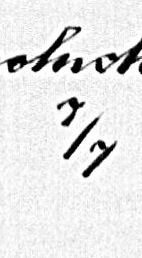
7/7
